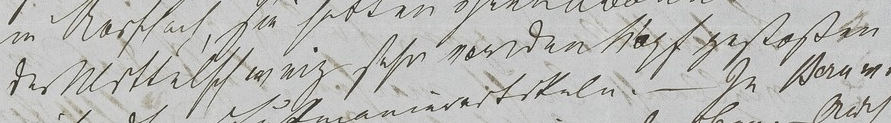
der Mittelschweiz sehr vor den Kopf gestoßen
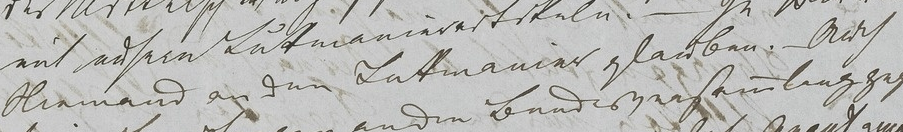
Niemand an den Lukmanier glauben. – Auch
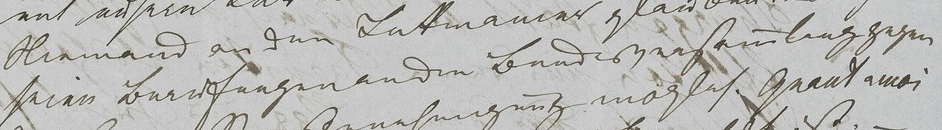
seien Berufungen an die Bundesversammlung gegen
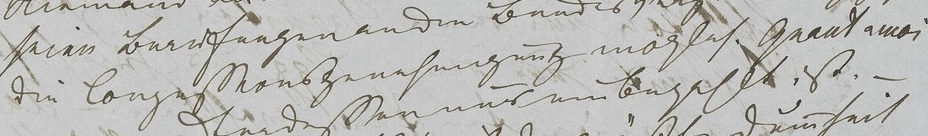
die Conzeßionsgenehmigung möglich. Quant a moi
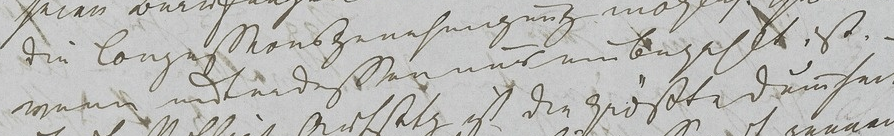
wenn unterdeßen nur einbezahlt ist. –
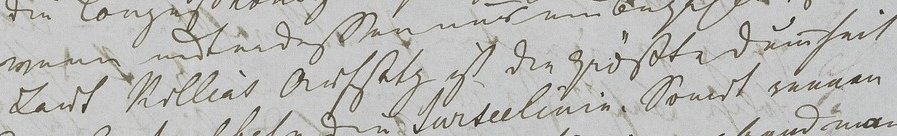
Laut Killias Aufsatz ist die größte Dummheit
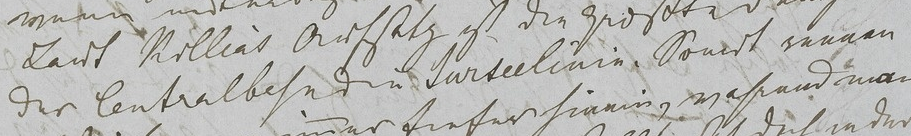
der Centralbahn die Surseelinie. Somit rennen
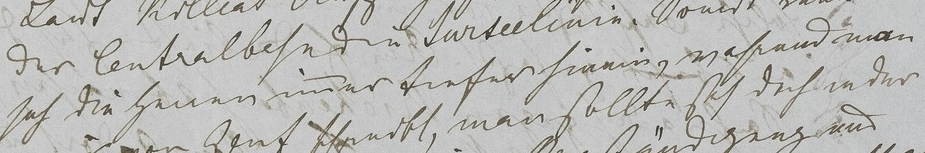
sich die Herren immer tiefer hinein, während man
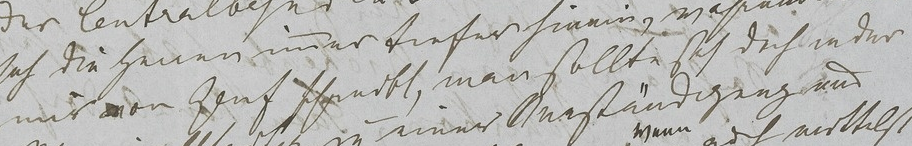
mir von Genf schreibt, man sollte sich doch in der
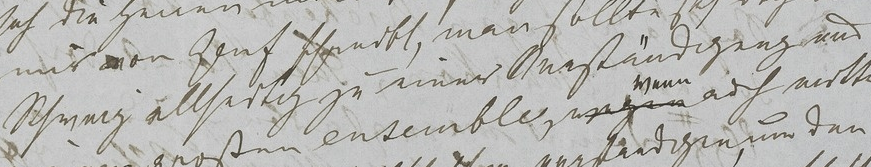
Schweiz allseitig zu einer Verständigung und
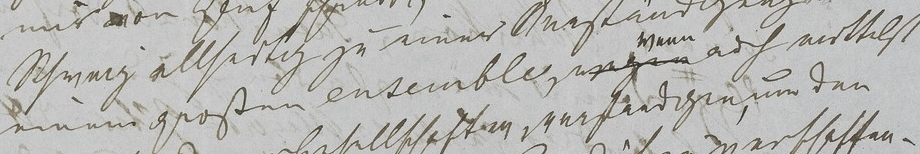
einem großen ensemble, wegenwenn auch mittelst
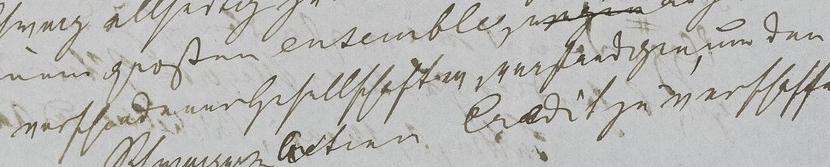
verschiedener Gesellschaften, verständigen, um den
